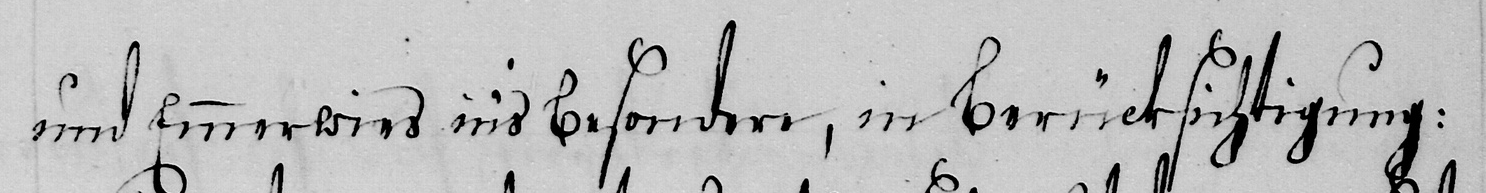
und Emmerwies in’s Besondere, in Berücksichtigung:
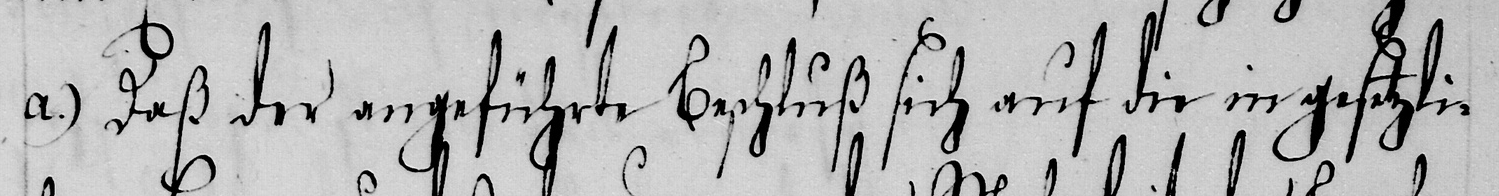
a.) Daß der angeführte Beschluß sich auf die in gesetzl¬
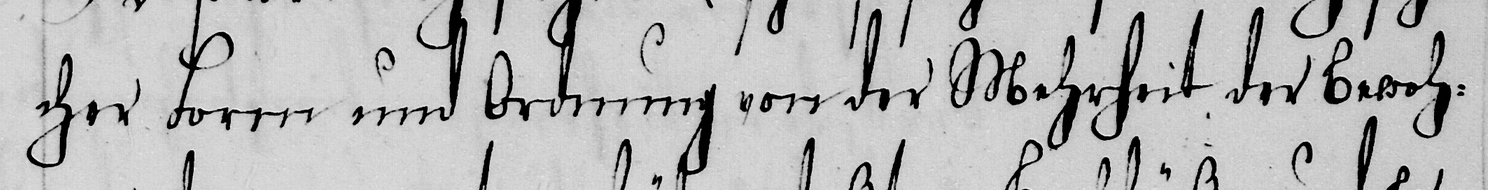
icher Form und Ordnung von der Mehrheit der Bewoh¬
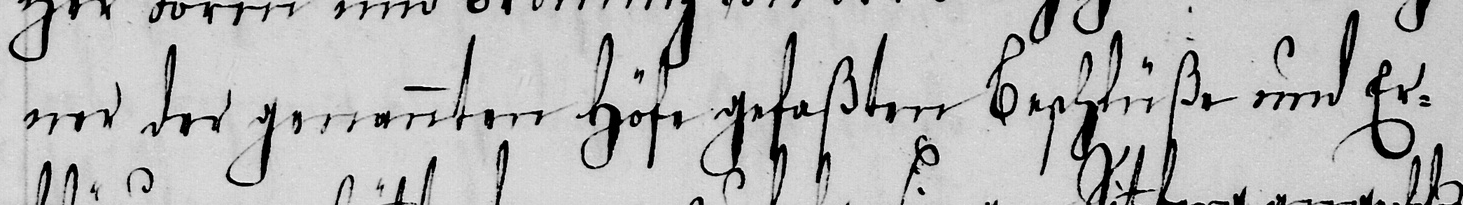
ner der genannten Höfe gefaßten Beschlüße und Er¬
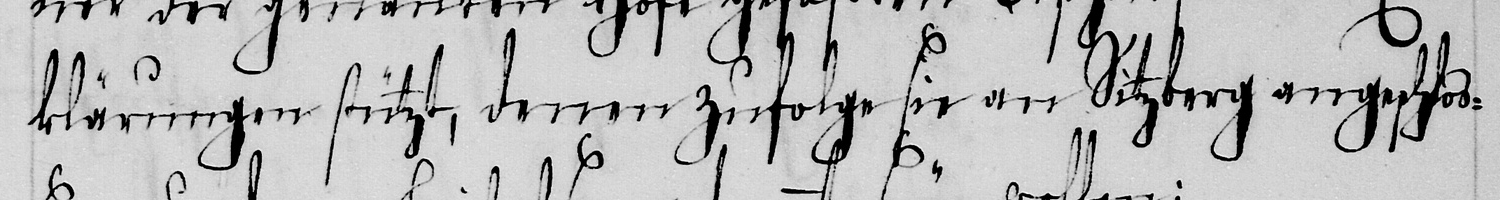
klärungen stützt, denen zufolge sie an Sitzberg angeschlo¬
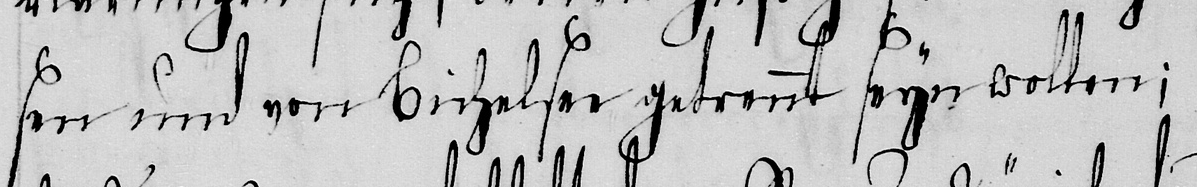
ßen und von Bichelsee getrennt seyn wollten;
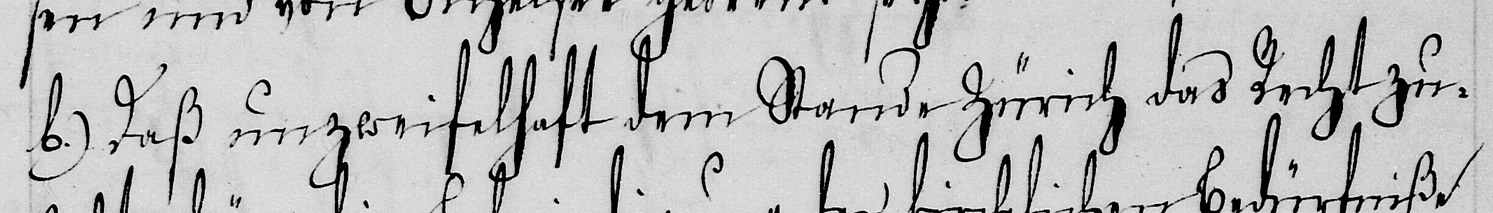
b.) Daß unzweifelhaft dem Stande Zürich das Recht zu¬
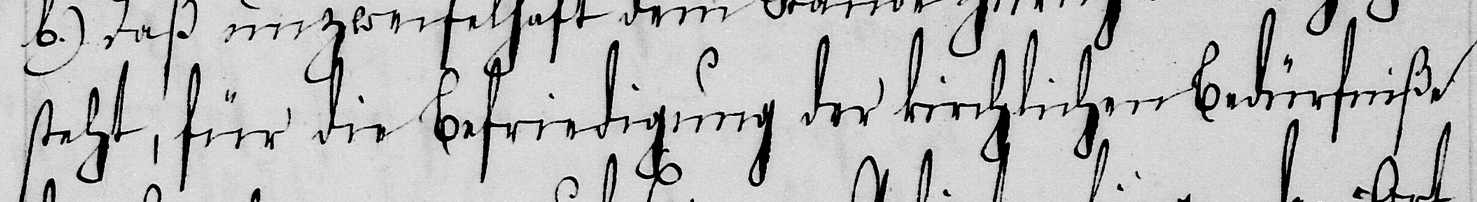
steht, für die Befriedigung der kirchlichen Bedürfniße
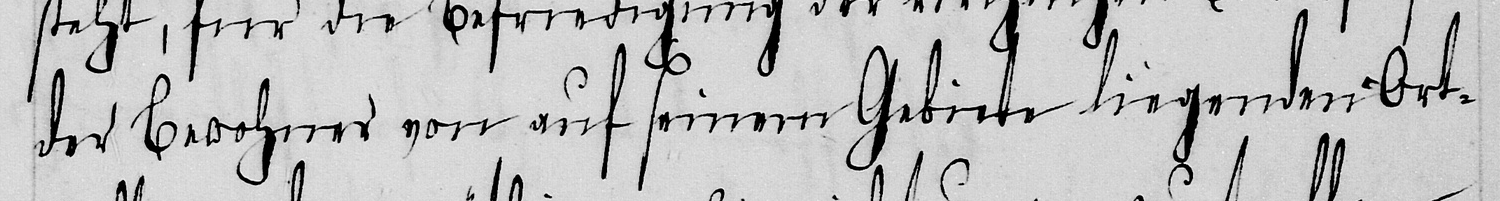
der Bewohner von auf seinem Gebiete liegenden Ort¬
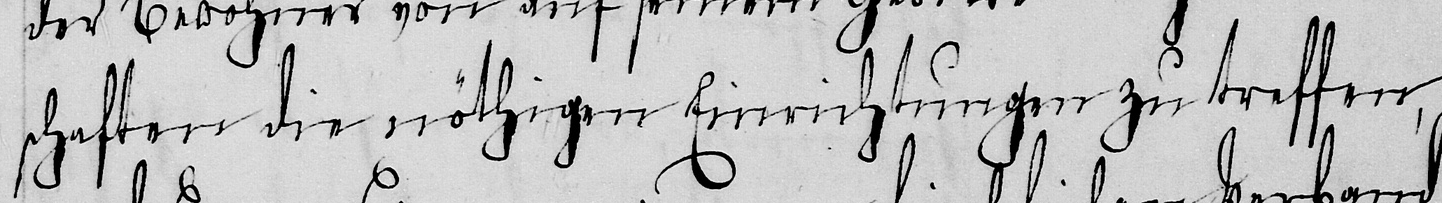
schaften die nöthigen Einrichtungen zu treffen,
